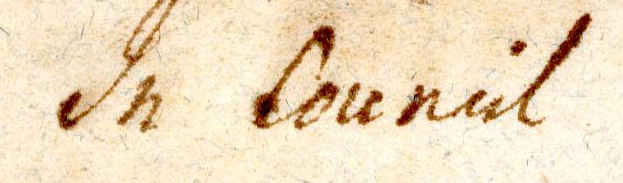In Council
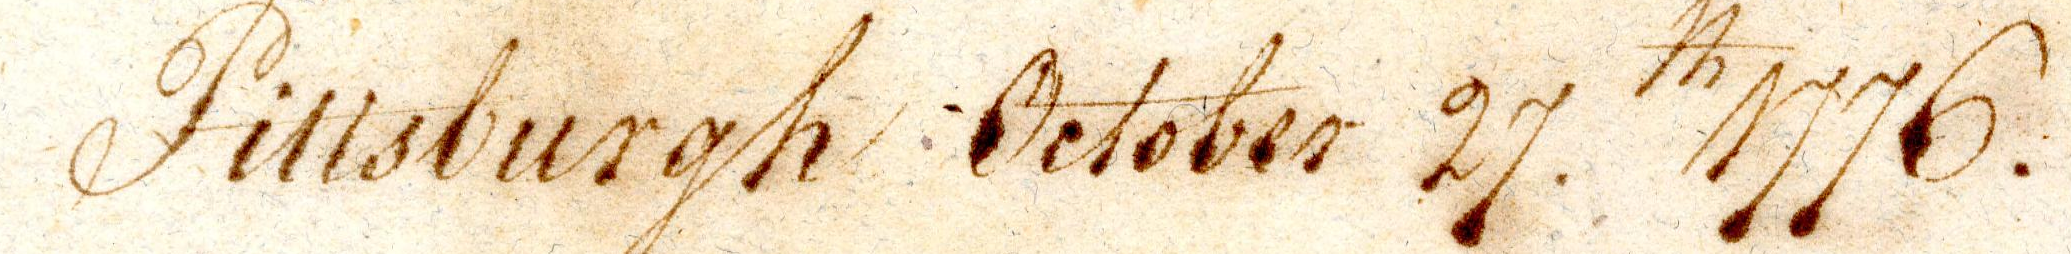Pittsburgh October 27.^th 1776.
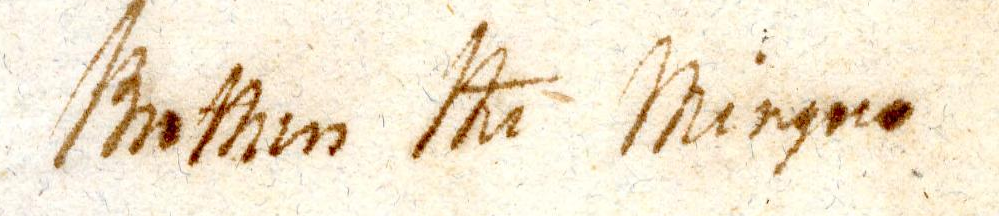Brothers the Mingoes
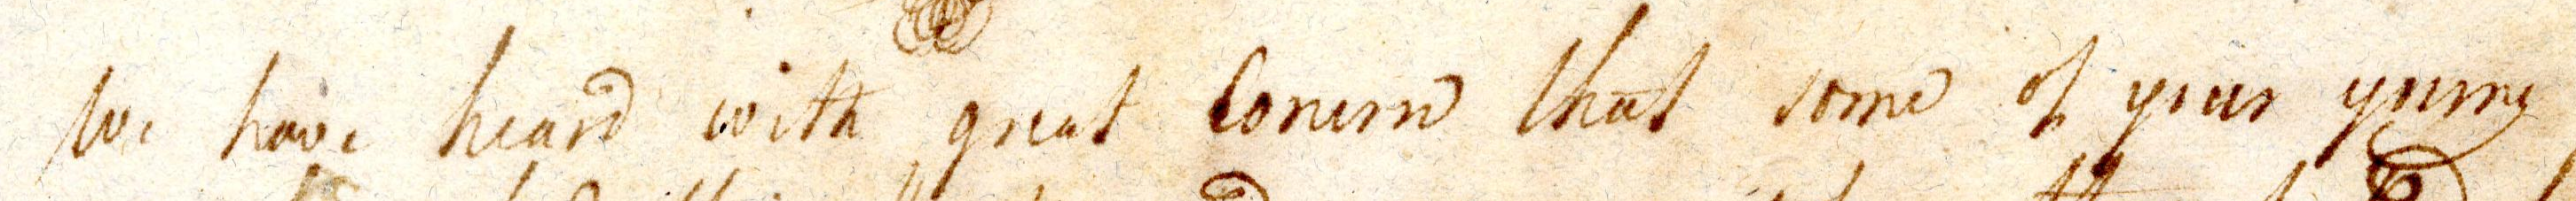We have heard with great Concern that some of your young
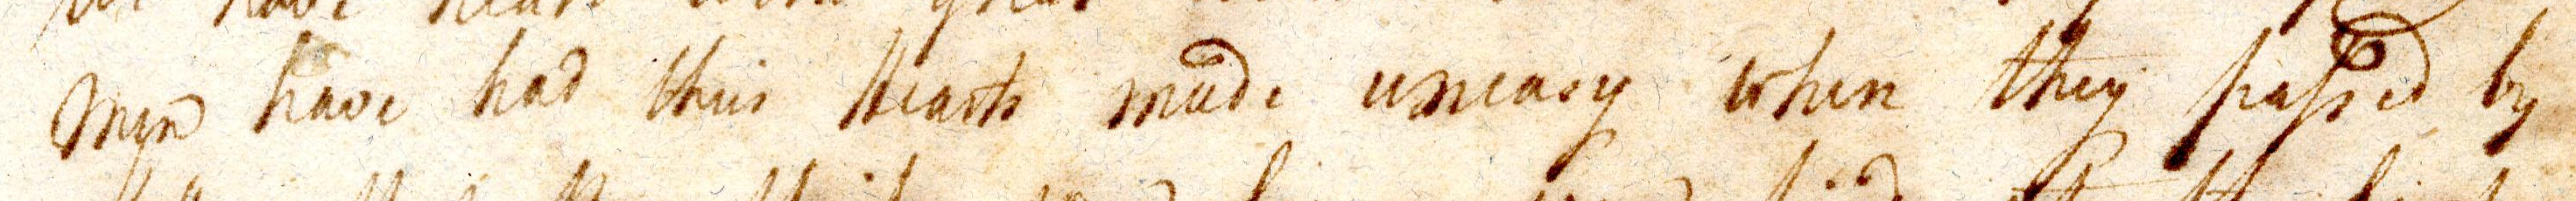Men have had their Hearts made uneasy when they passed by
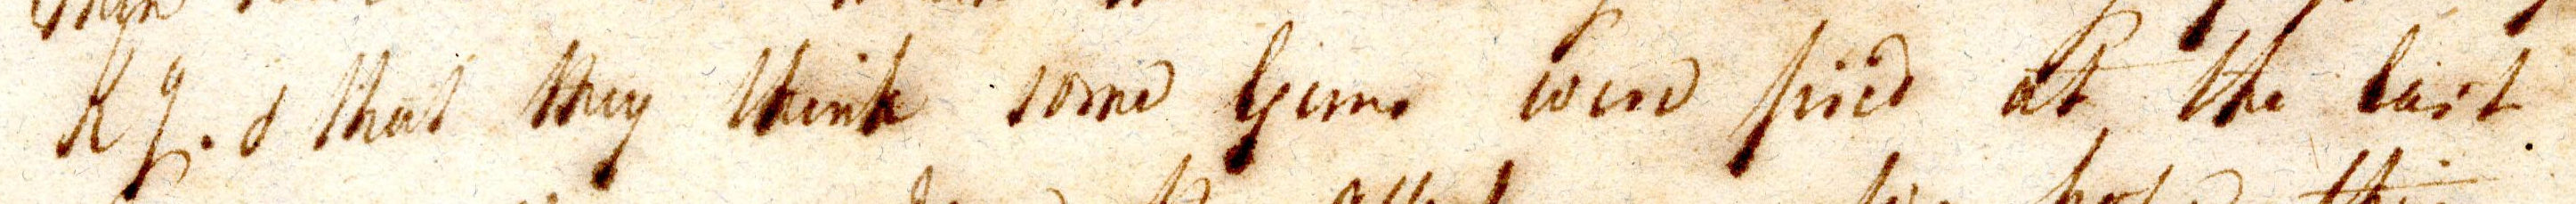K^g & that they think some Guns were spied at the last
